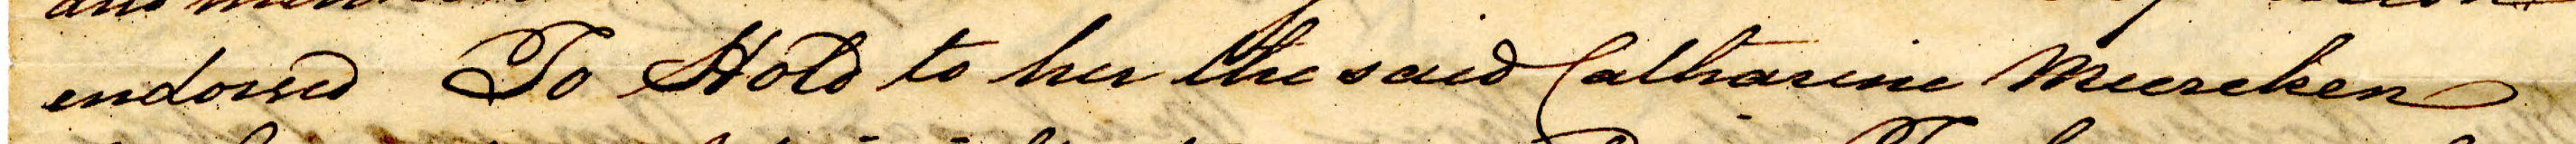endorsed To Hold to her the said Catharine Miercken
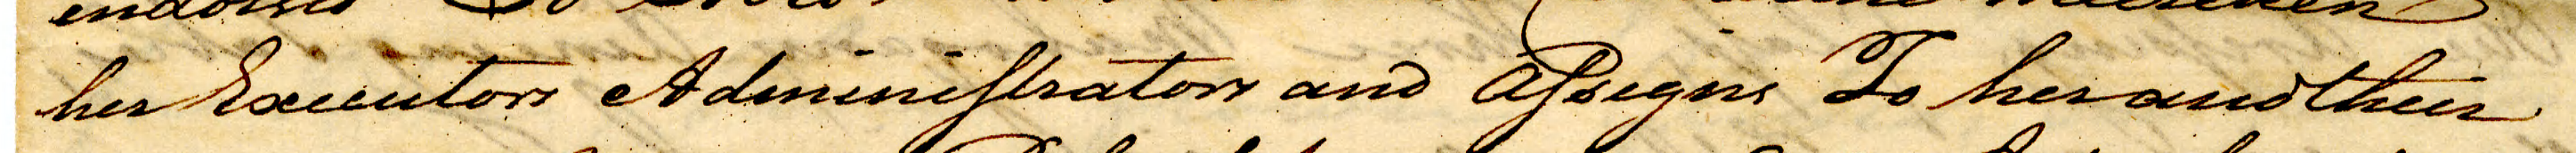her Executors Administrators and assigns To her and their
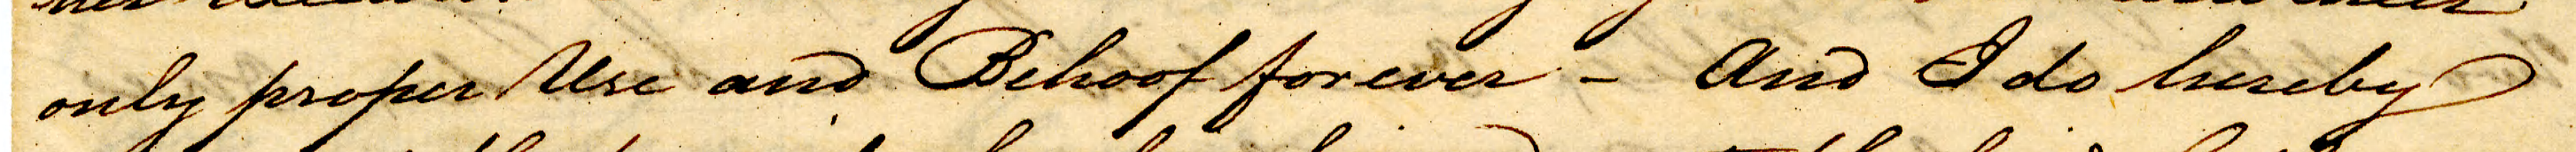only proper use and Behoof for ever – and I do hereby
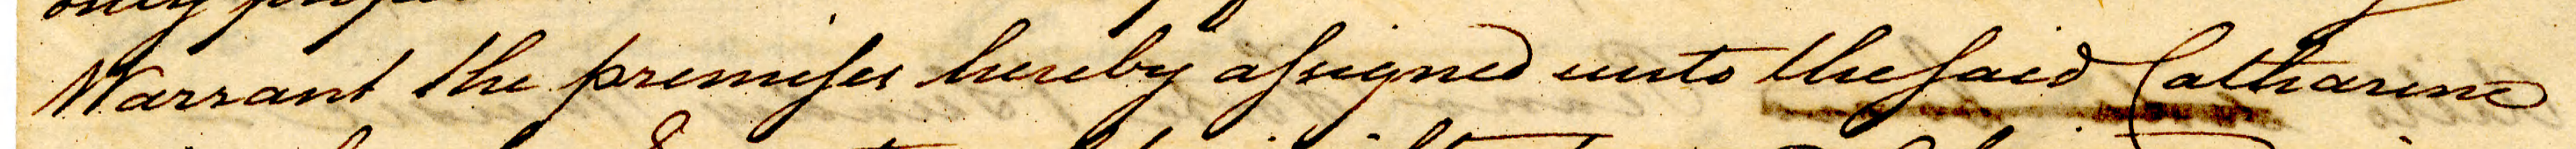Warrant the premises hereby assigned unto the said Catharine
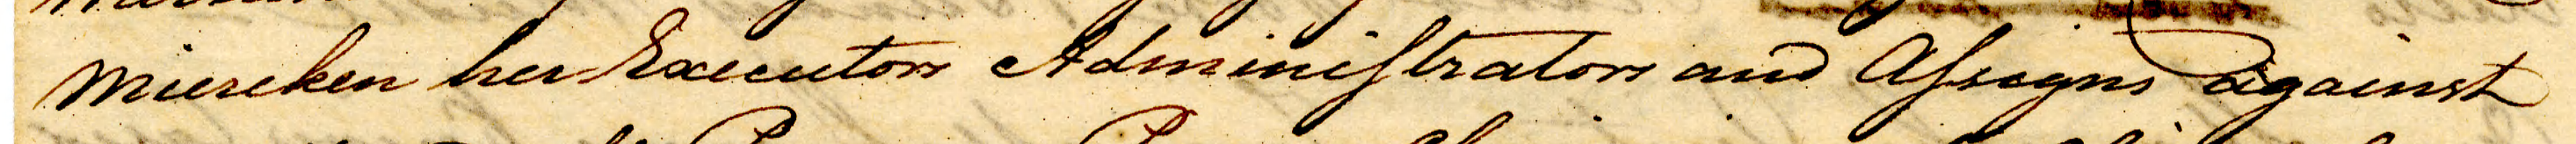Miercken her Executor Administrator and Assigns against
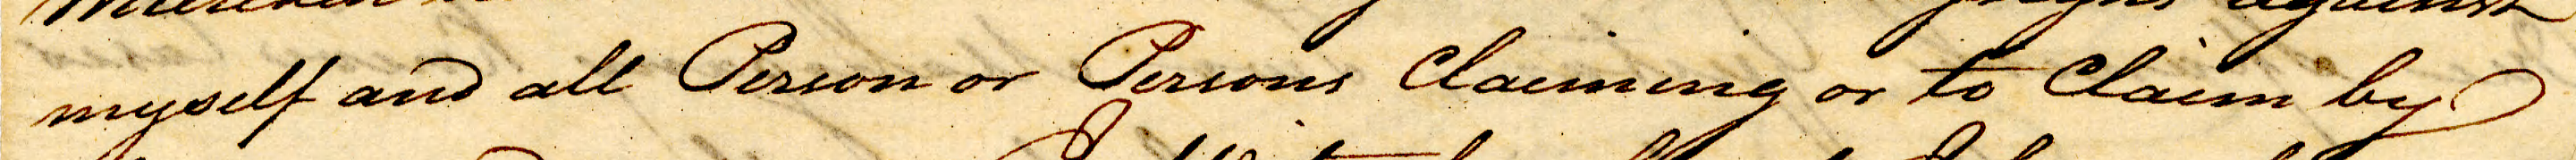myself and all Person or Persons Claiming or to Claim by
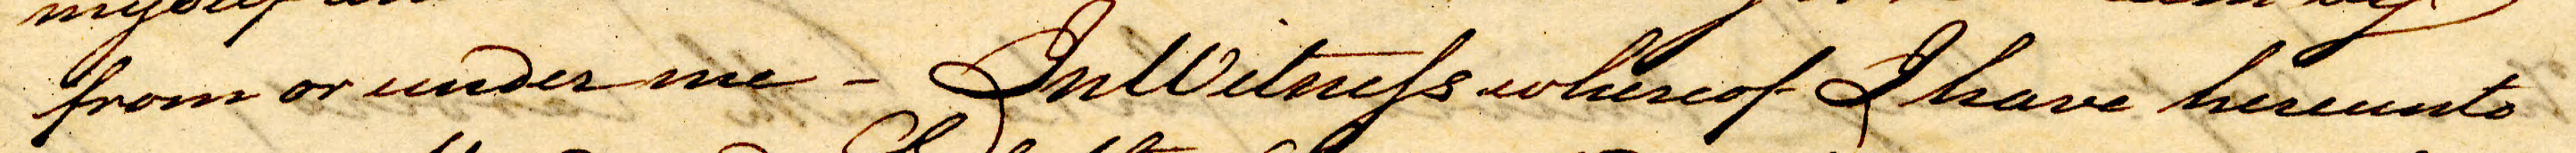from or under me In Witness whereof I have hereunto
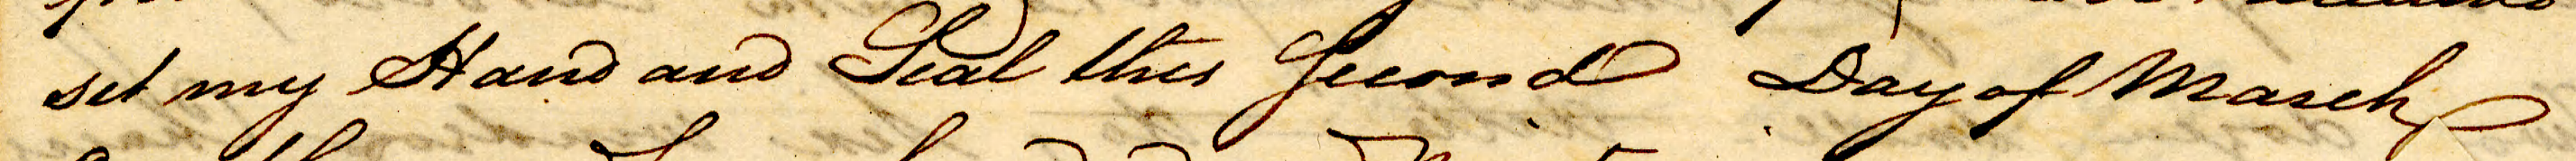set my Hand and Seal this second Day of March
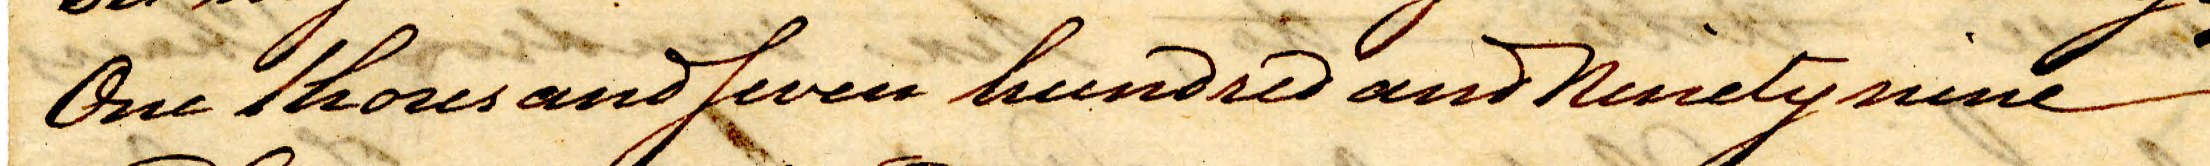One thousand seven hundred and ninety nine
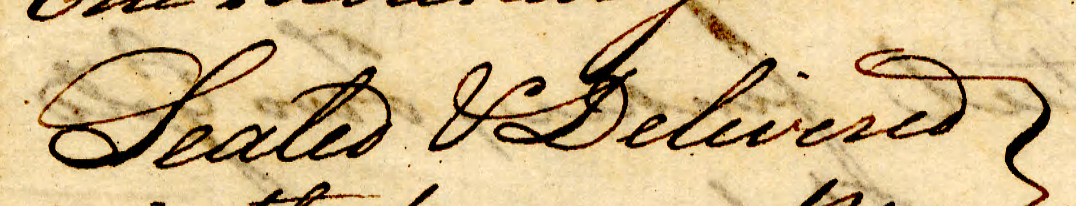Sealed & Delivered
